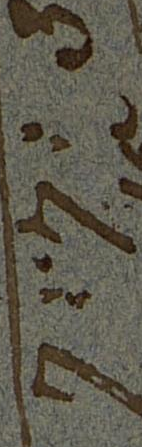7:7:3
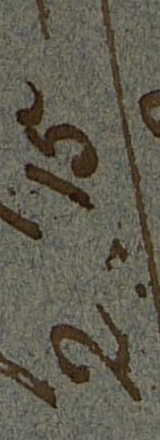2..15 -
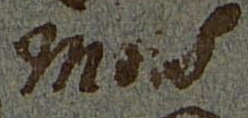Ms S
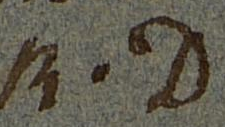R .D
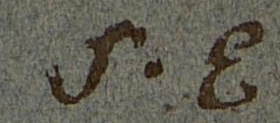S.E
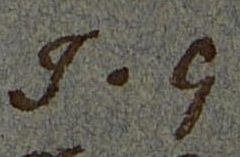I.G
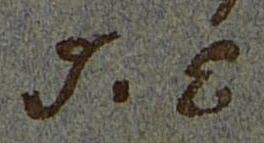I. E
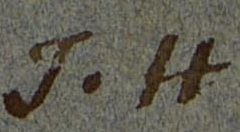I. H
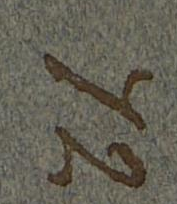72
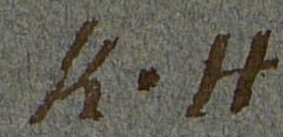K. H
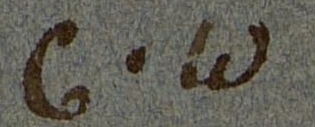C.W
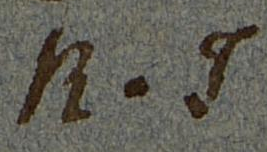R.J
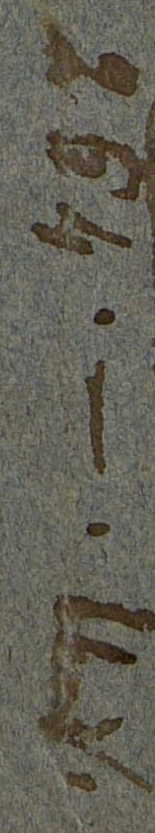264 . - . 11 1/2
